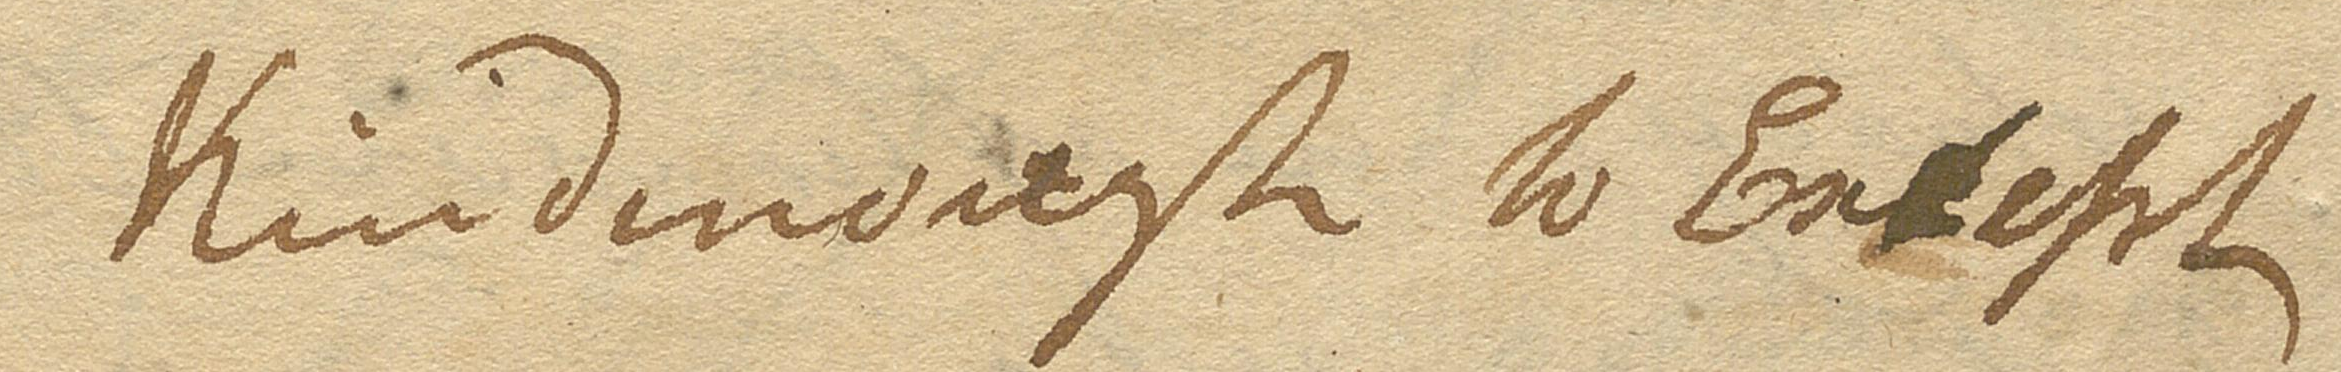Kind enough to Except
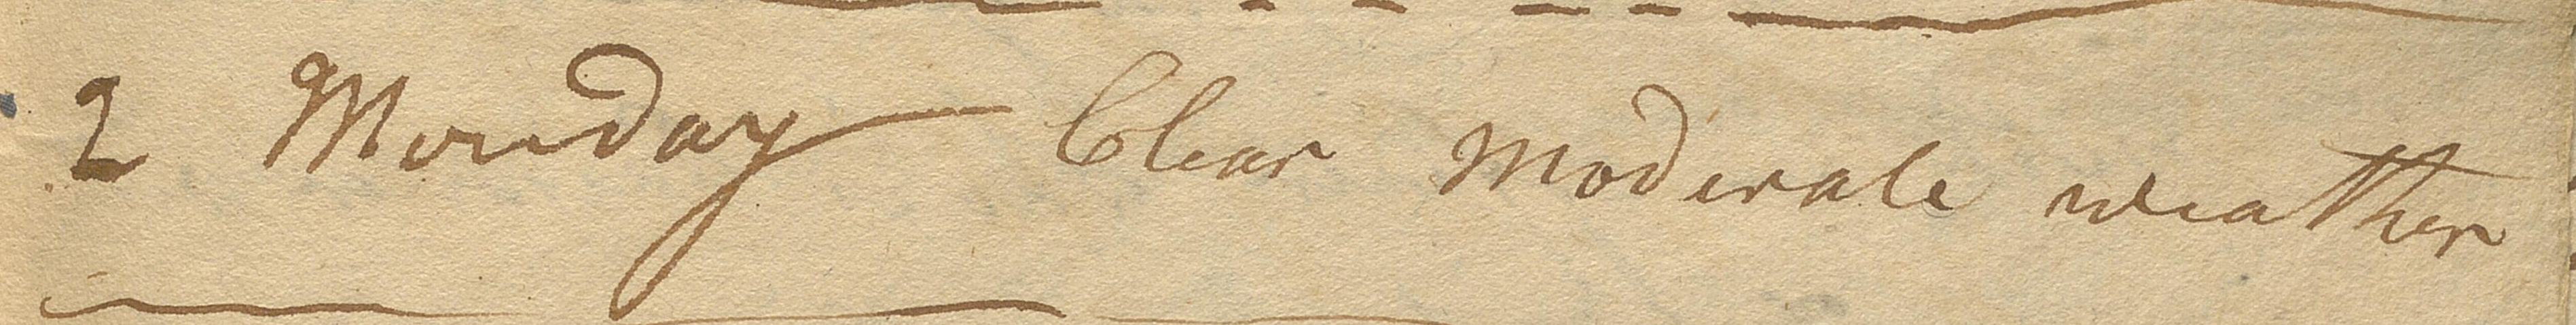2 Monday Clear Moderate weather
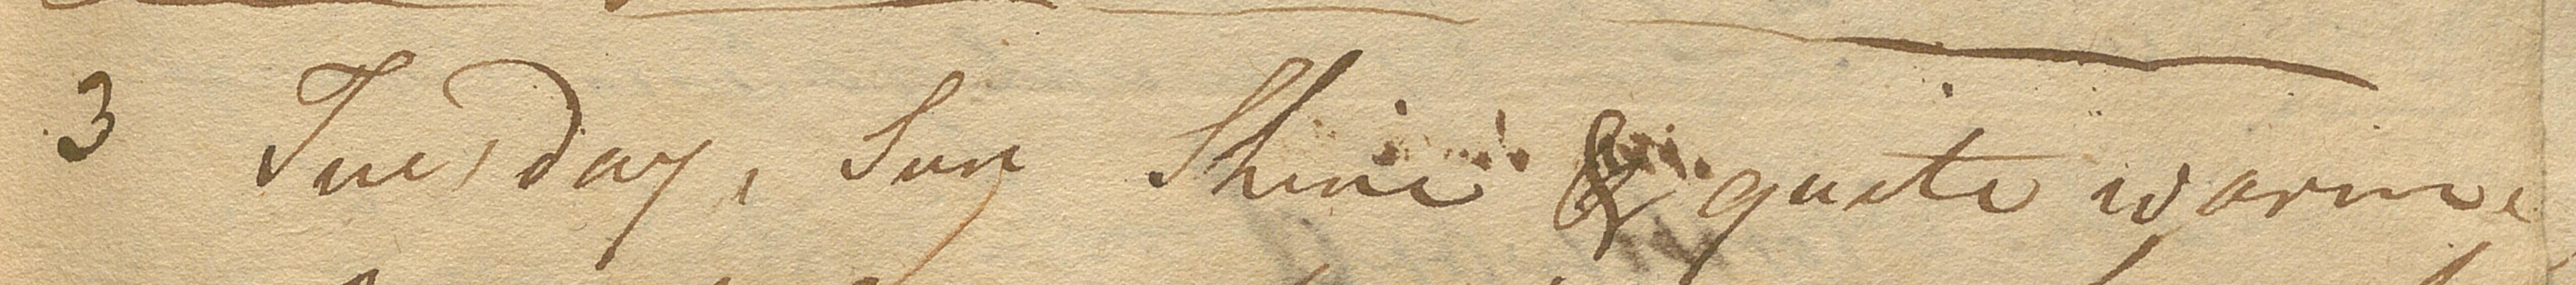3 Tuesday, Sun Shine & quite warme
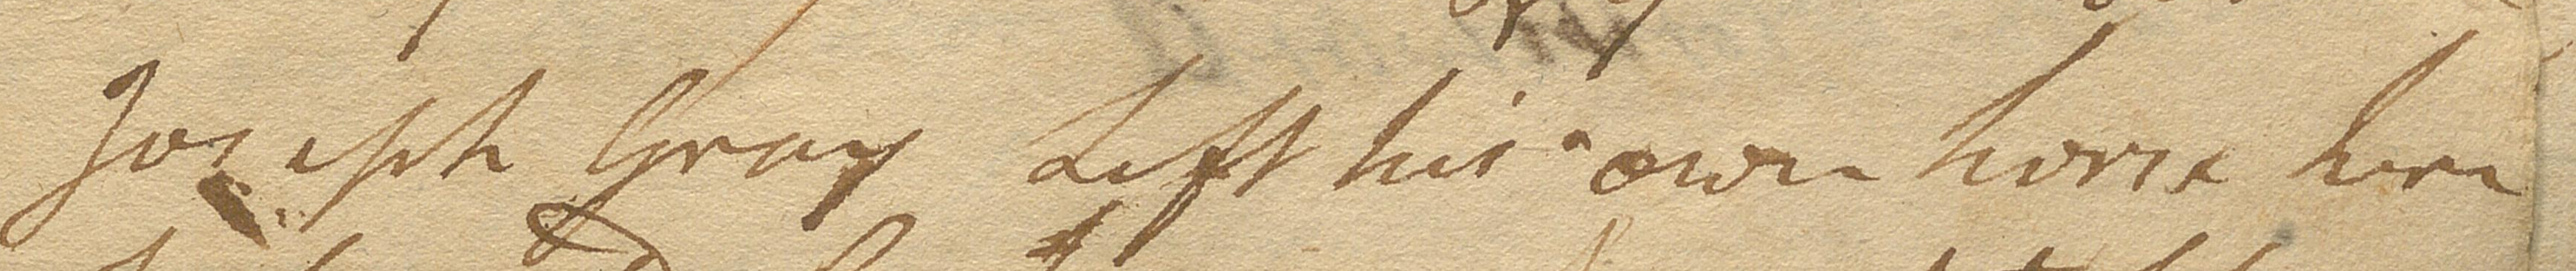Joseph Gray Left his own horse here
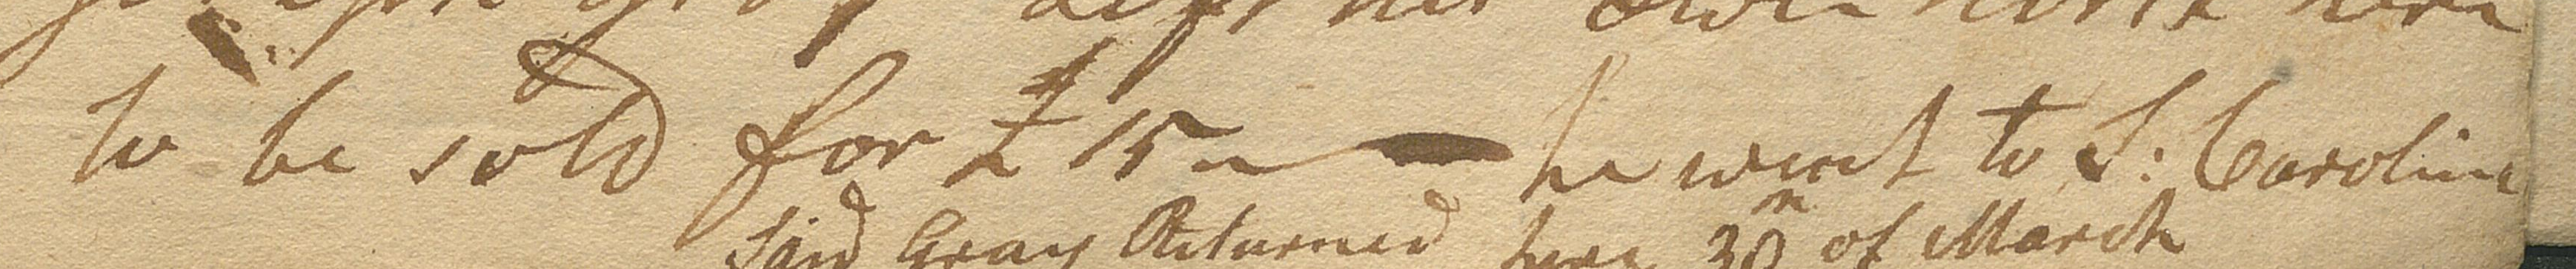to be sold for £15- he went to S: Carolina
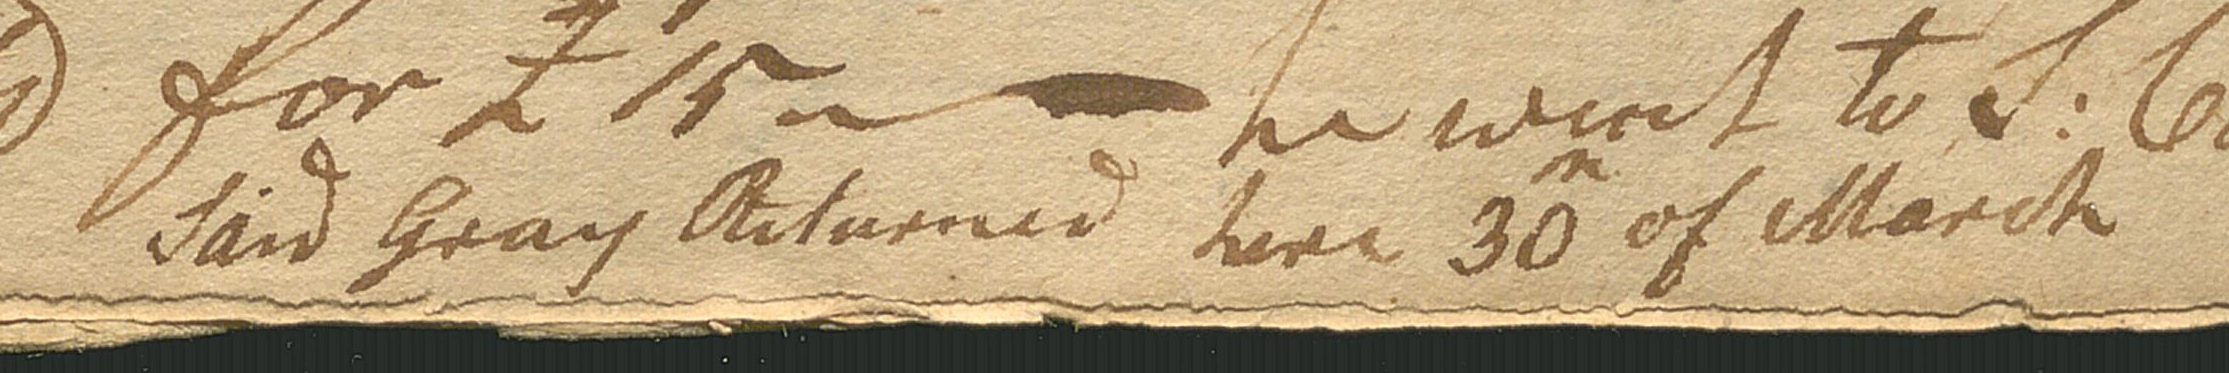Said Gray Returned here 30^th of March
